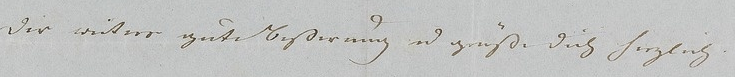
Dir weiters gute Beßerung u grüße dich herzlich.
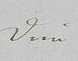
Dein
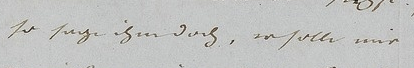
so sage ihm doch, er solle mir
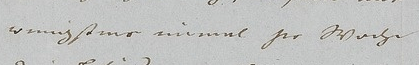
wenigstens einmal pr Woche
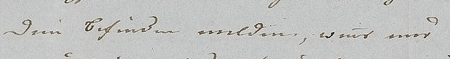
Dein Befinden melden, wenns nur
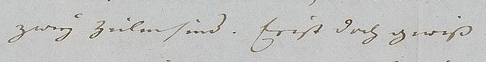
zwey Zeilen sind. Es ist doch gewiß
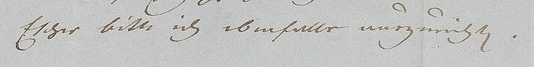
Escher bitte ich ebenfalls auszurichten.
